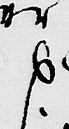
r¬
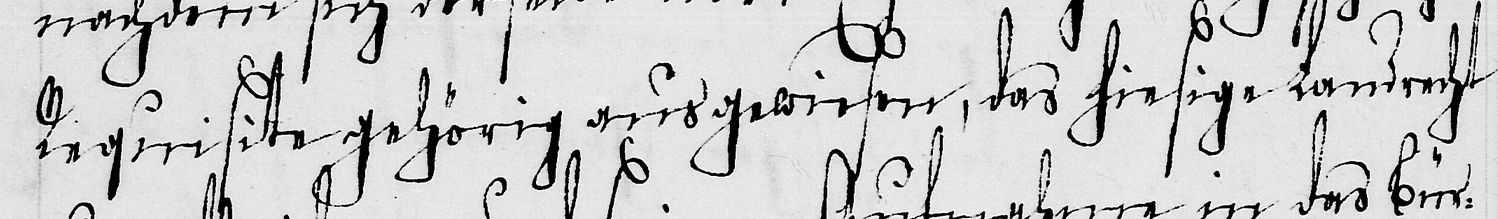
Requisite gehörig ausgewiesen, das hiesige Landrecht
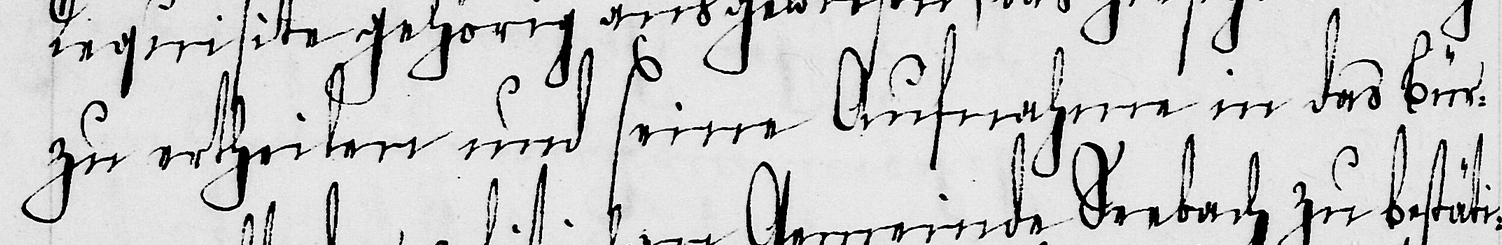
zu erhteilen und seine Aufnahme in das Bür¬
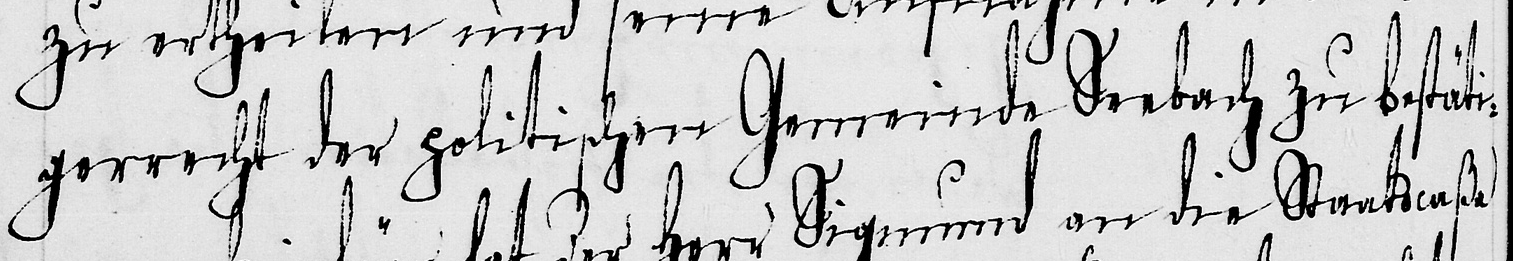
gerrecht der politischen Gemeinde Seebach zu bes¬
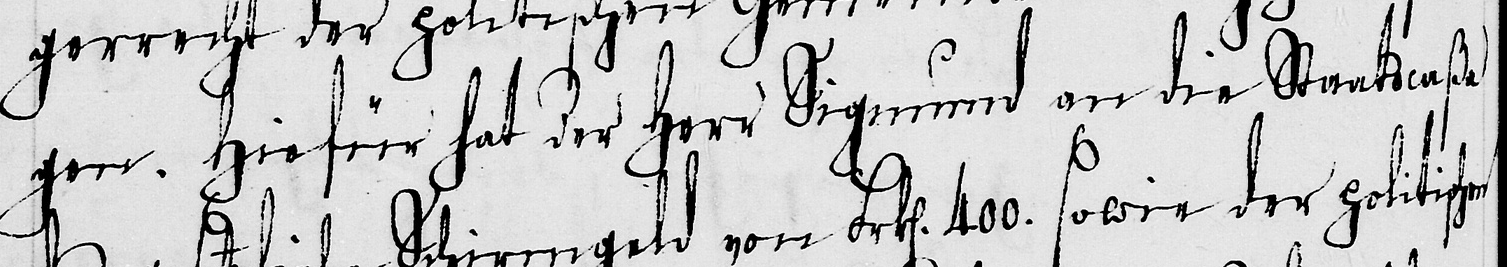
gen. Hiefür hat der Herr Sigmund an die Staatscaßa
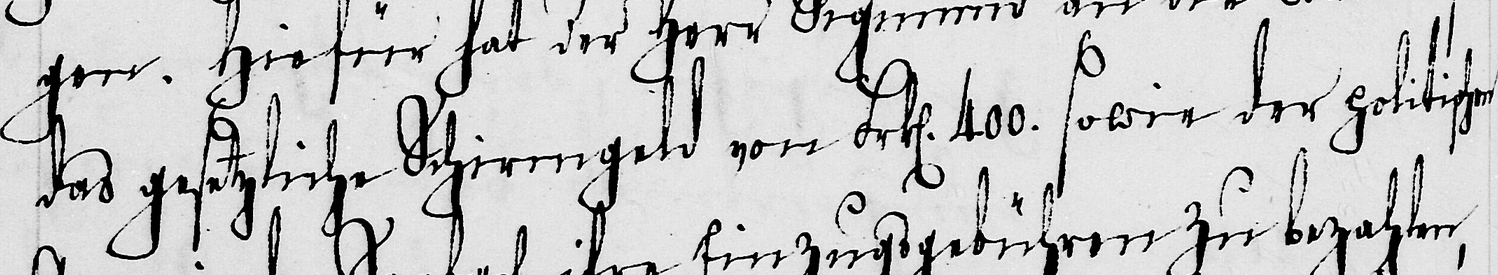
das gesetzliche Schirmgeld von Frk[en]. 400. sowie
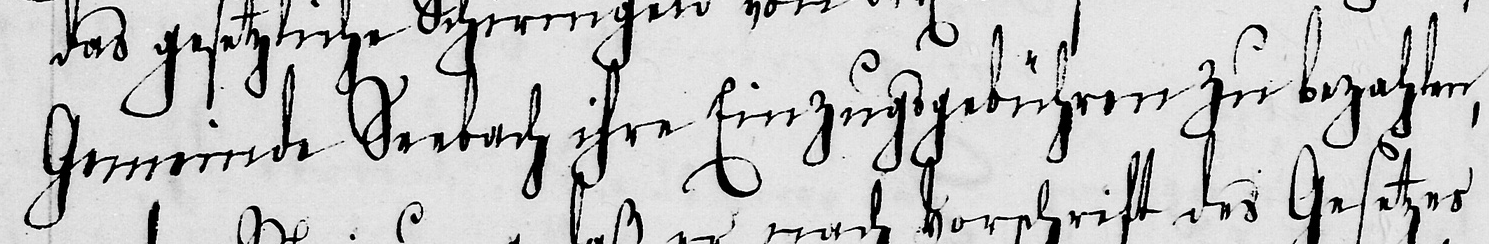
Gemeinde Seebach ihre Einzugsgebühren zu bezahlen,
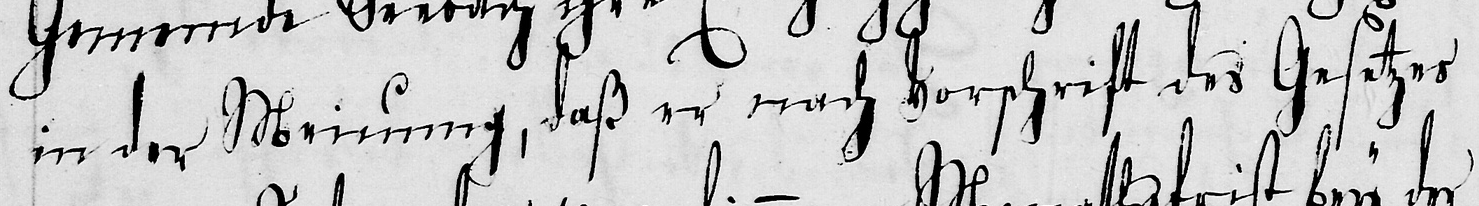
in der Meinung, daß er nach Vorschrift des Gesetzes
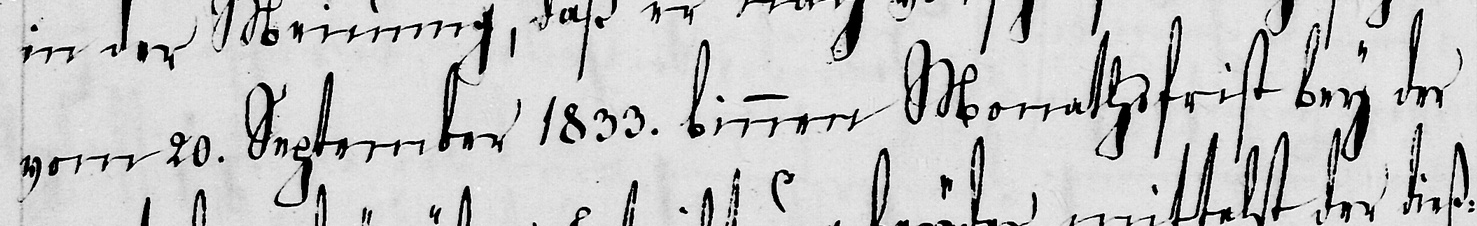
vom 20. September 1833. binnen Monathsfrist bey der
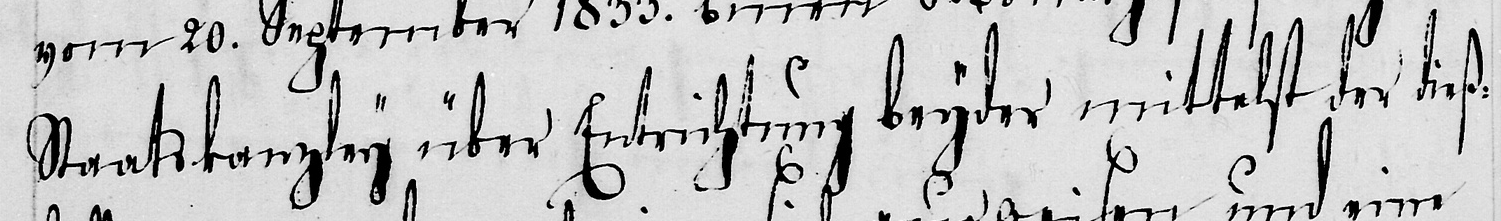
Staatskanzley über Entrichtung beyder mittelst der die¬
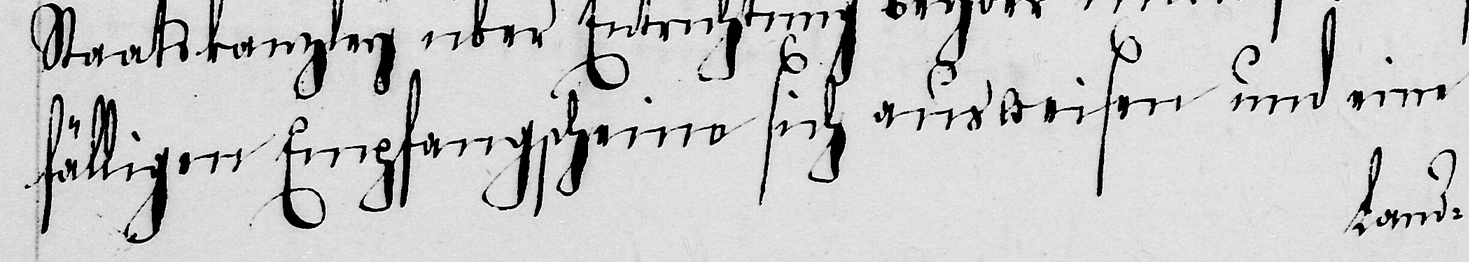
ßfälligen Empfangscheine sich ausweisen und eine
